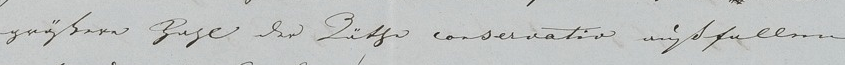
größere Zahl der Räthe conservativ außfallen
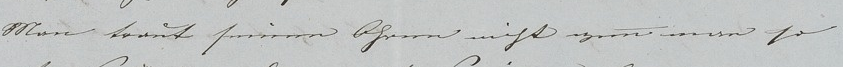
Man traut seinen Ohren nicht wenn man so
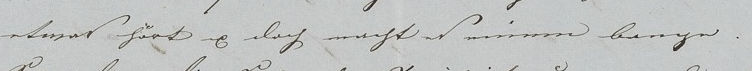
etwas hört & doch macht es einem bange.
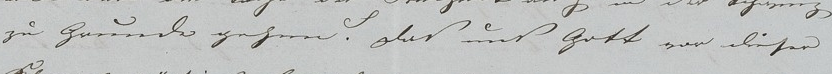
zu Grunde gehen? Das uns Gott vor dieser
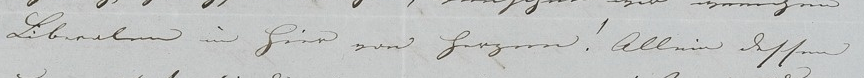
Liberalen in Hier von Herzen! Allein dessen
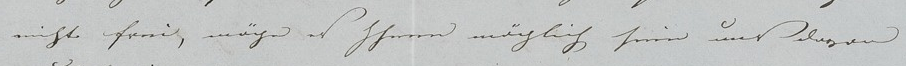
nicht frei, möge es Ihnen möglich sein uns davon
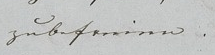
zubefreien.
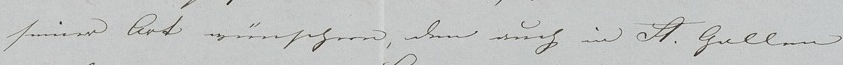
seiner Art wünschen, den auch in St. Gallen
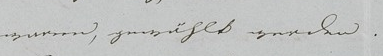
waren, gewählt werden.
